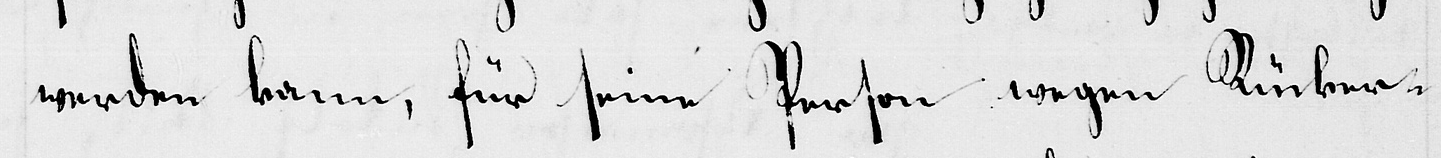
werden kann, für seine Person wegen Rücker¬
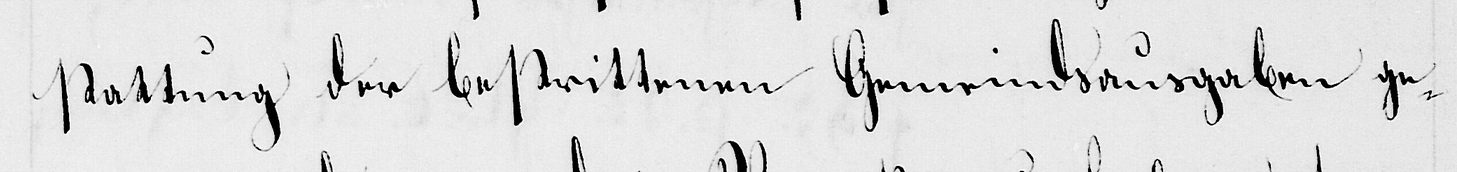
stattung der bestrittenen Gemeindsausgaben ge¬
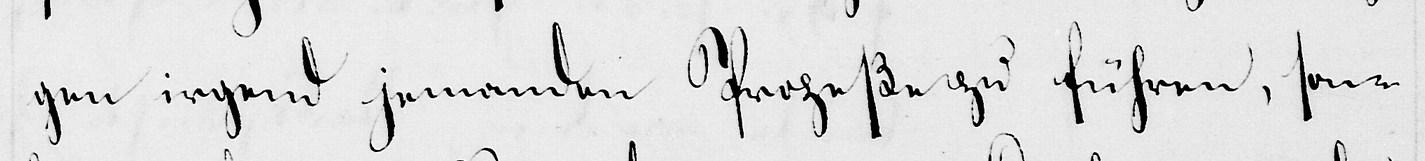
gen irgend jemanden Prozeße zu führen, son¬
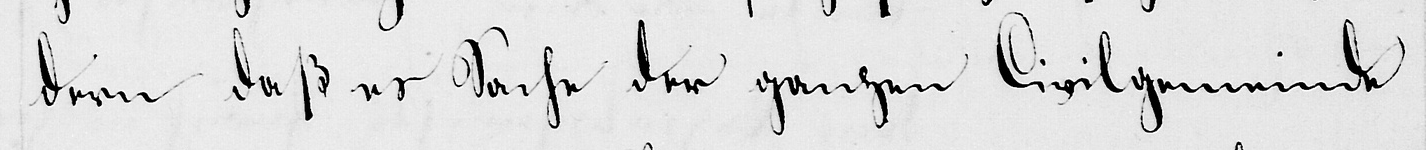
dern daß es Sache der ganzen Civilgemeinde
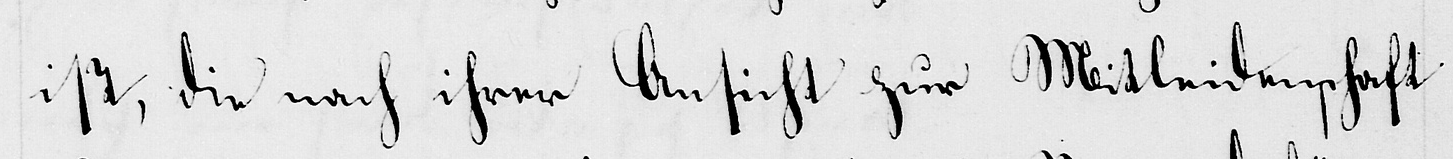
ist, die nach ihrer Ansicht zur Mitleidenschaft
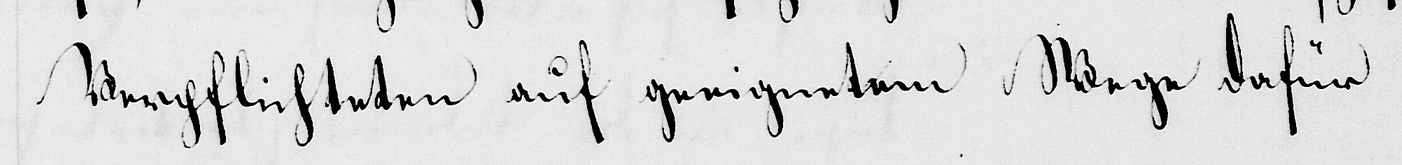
Verpflichteten auf geeignetem Wege dafür
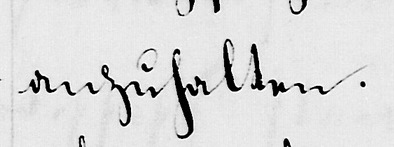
anzuhalten.
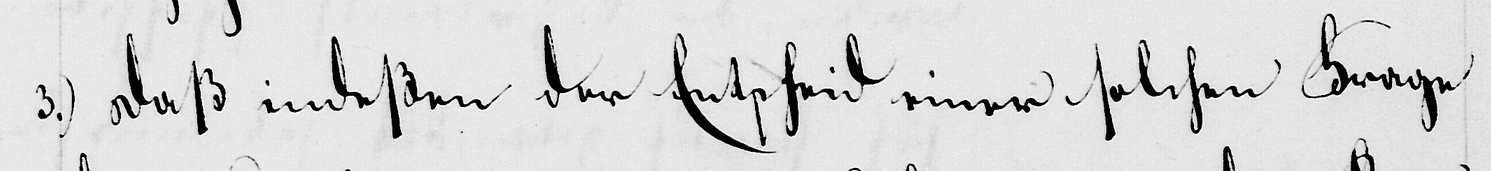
3.) Daß indeßen der Entscheid einer solchen Frage
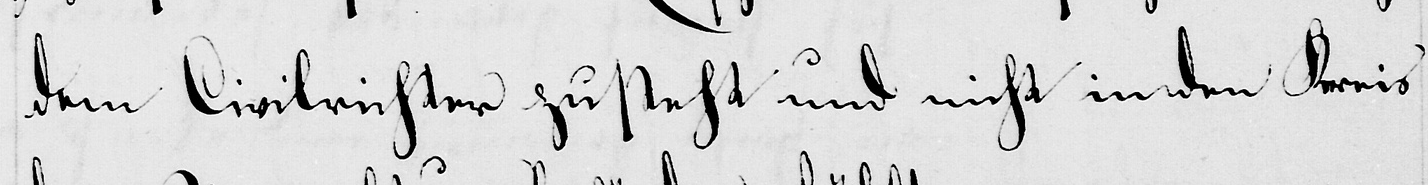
dem Civilrichter zusteht und nicht in den Kreis
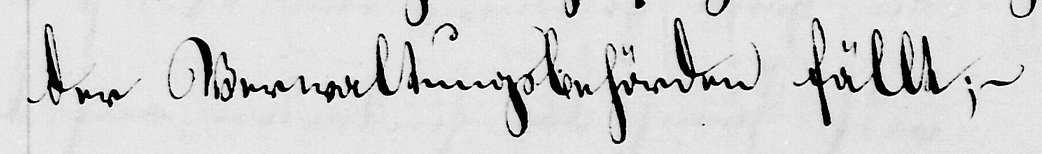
der Verwaltungsbehörden fällt; –
